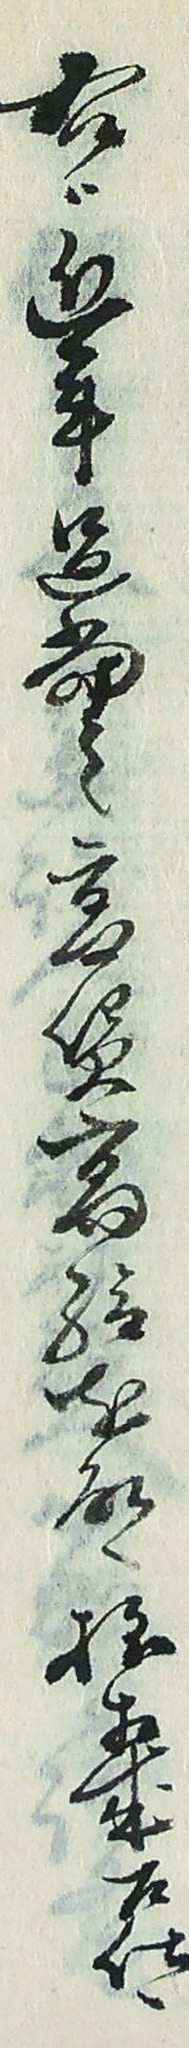右ハ近年過當之高賃高給を取候様相成召仕候
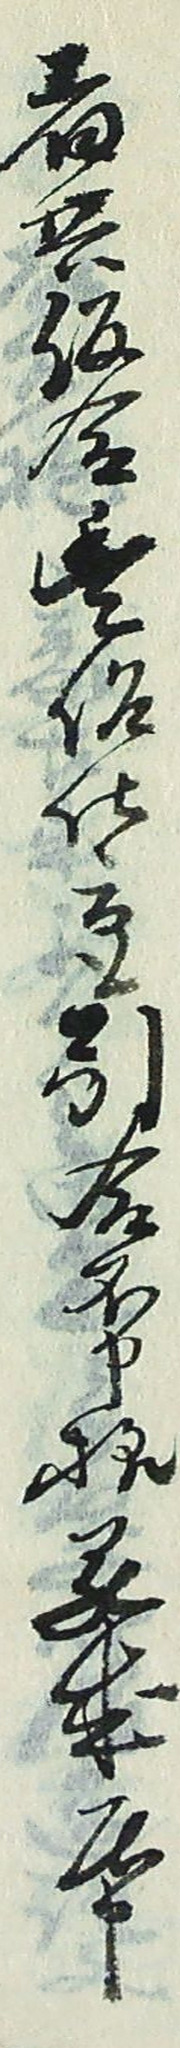者共仮令豊作仕候而も引合不申様罷成居申
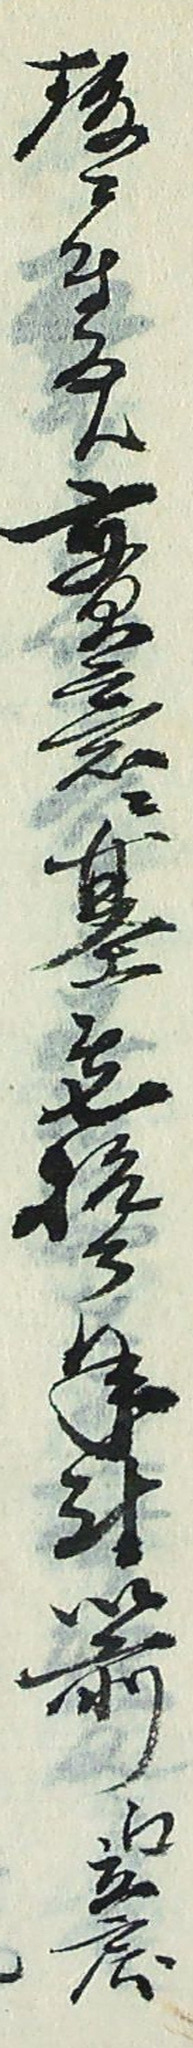趣ニ付而ハ實意ニ基先拾ケ年計以前江立戻
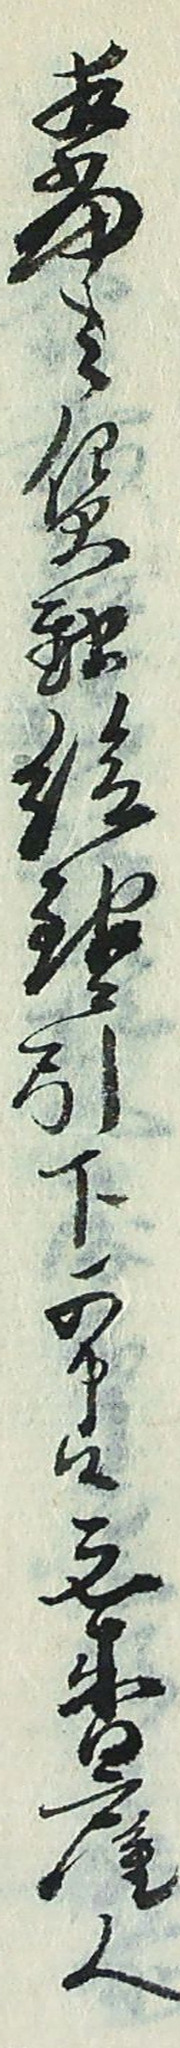相當之賃銀給銀ニ引下可申候元来日雇人
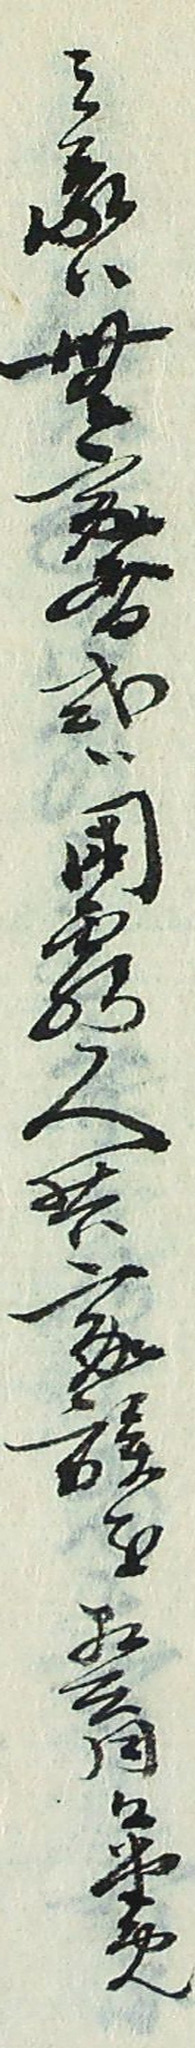之義ハ無家居或ハ困窮人共家族を相育て候ため
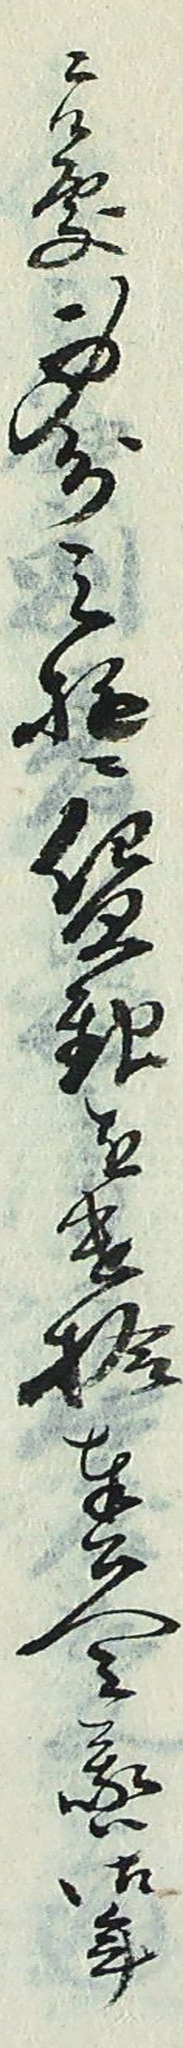ニ候處身分之遊ニ賃銀を遣捨奉公人之義ハ御年
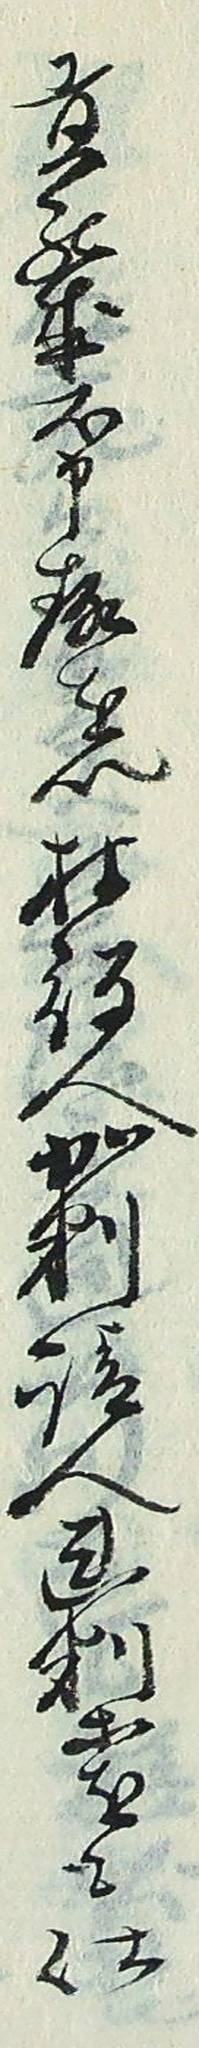貢罷成不申趣を以村役人加判請人連判等をも仕
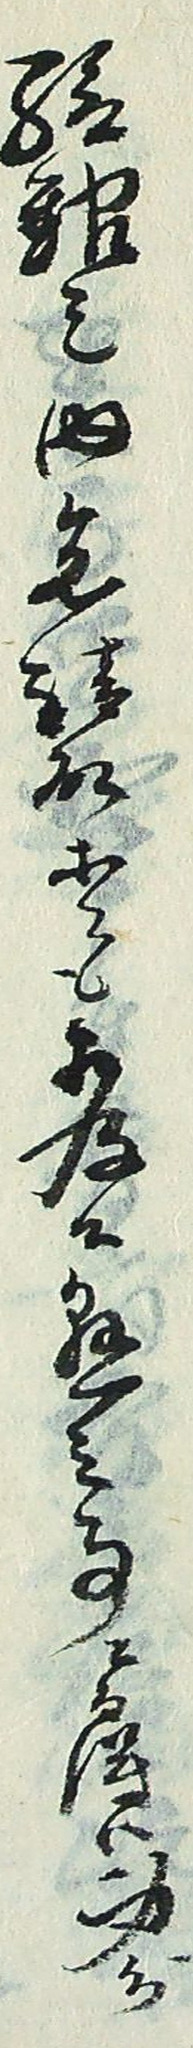給銀之内先請取等ニも相及候懸之事ニ候得ハ身分
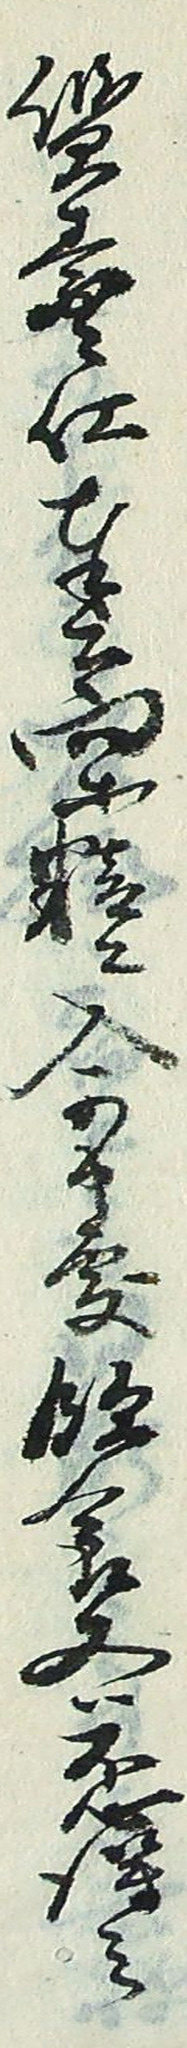質素ニ仕奉公向等精ニ入可申處飲食又ハ不心得之
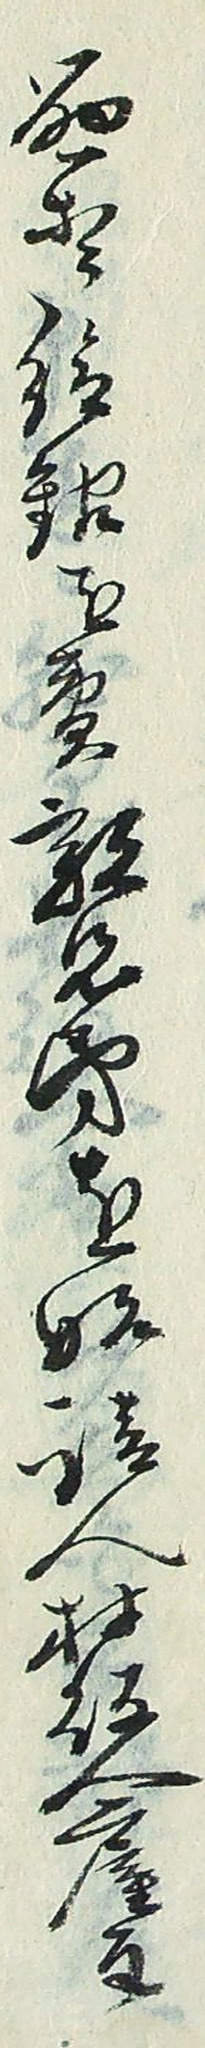筋等ニ給銀を費親兄弟を始請人村役人雇主

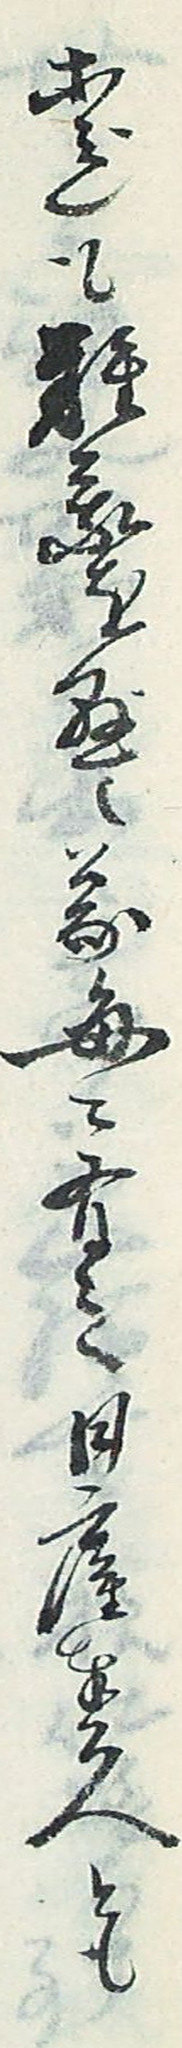等迄も難義を懸候義毎々有之日雇奉公人とも
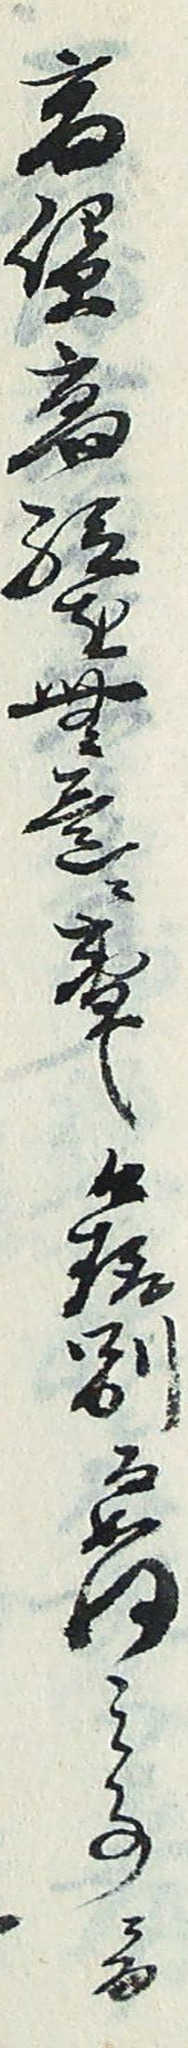高賃高給を無意ニ費し候趣別而如何之事ニ而
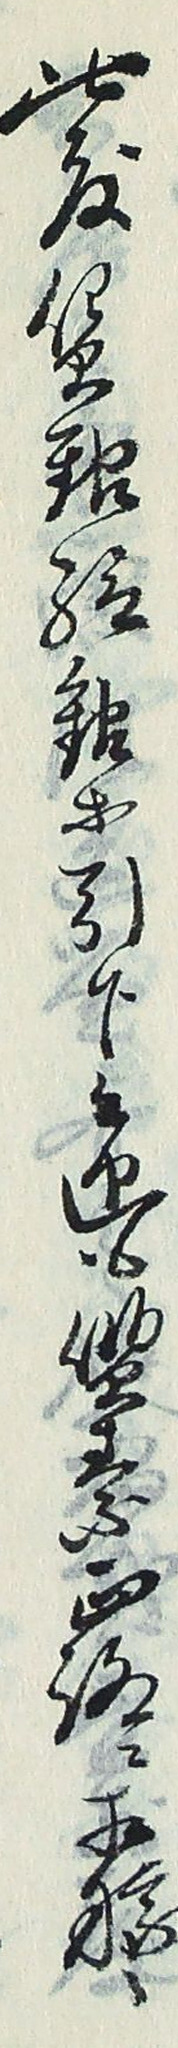此度賃銀給銀等引下候迚も質素正路ニ相稼候
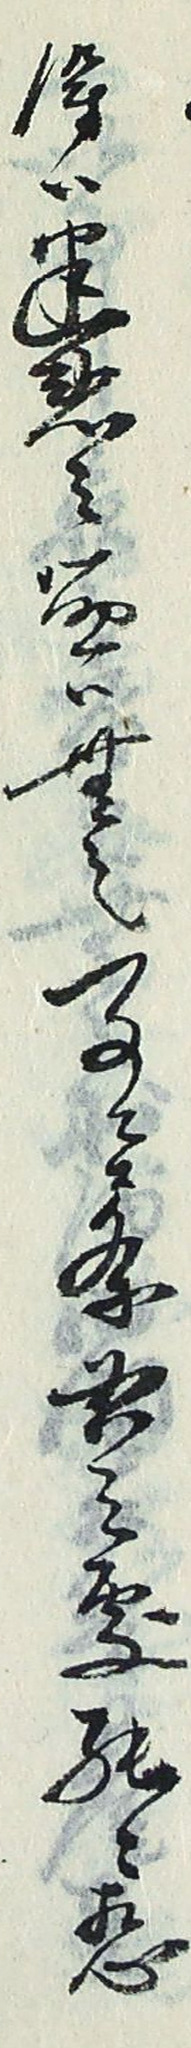得ハ迷惑之筋ハ無之事ニ候条右之處能々相心
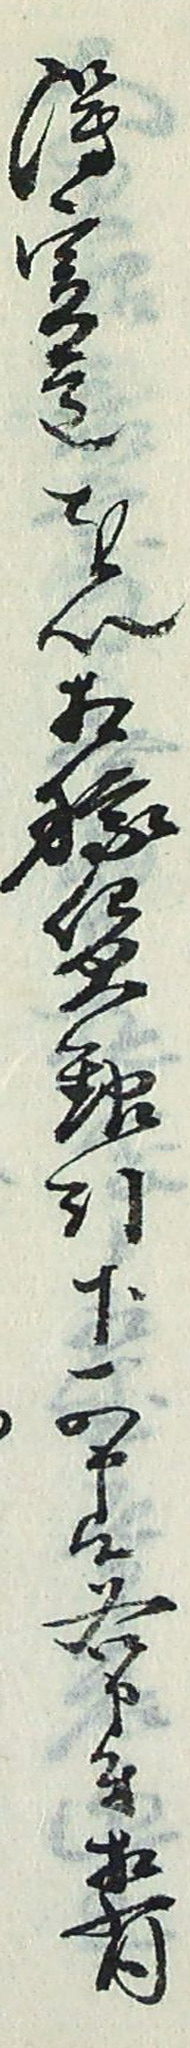得実意を以相稼賃金引下可申候右申付相背
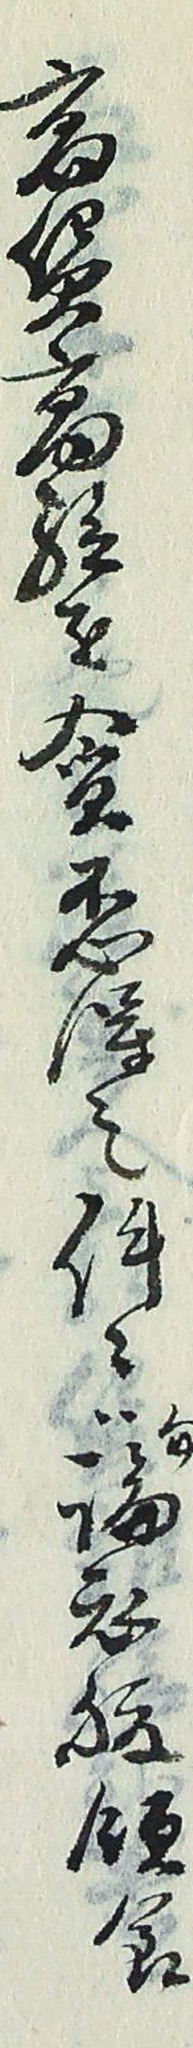高賃高給を貪不心得之件々ハ勿論衣服飲食
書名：諸御趣意書并御下知向之写
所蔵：鳴門教育大学 Naruto University of Education
